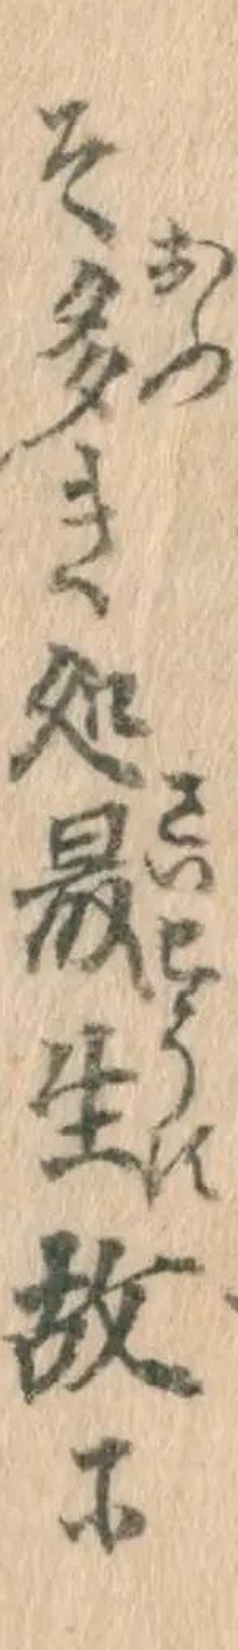そ多き処最生故に
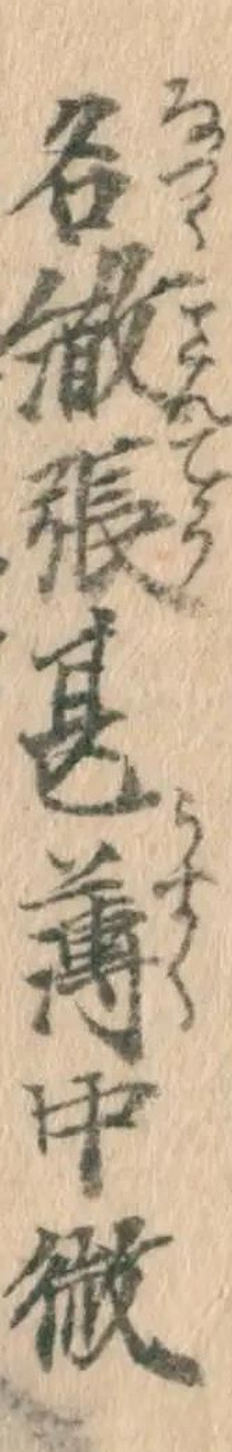名繖張甚薄中微
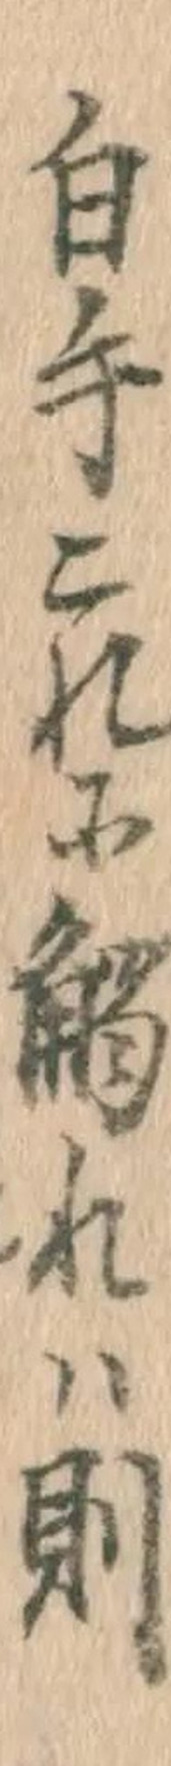白手これに触れは則
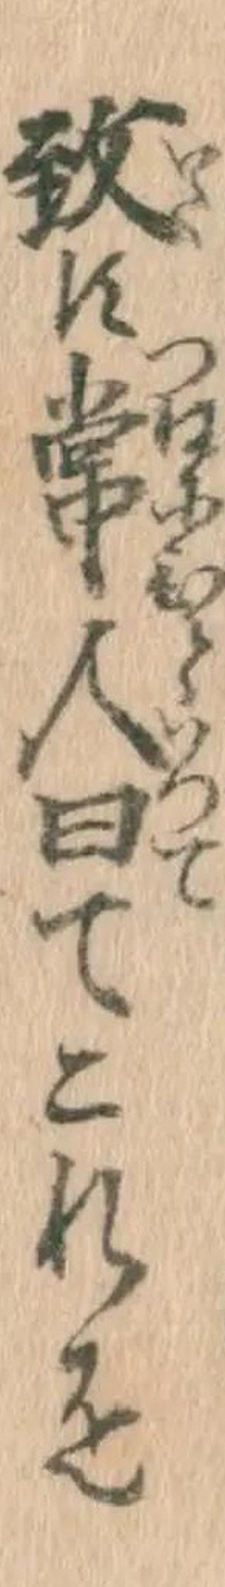致す常人曰てこれを
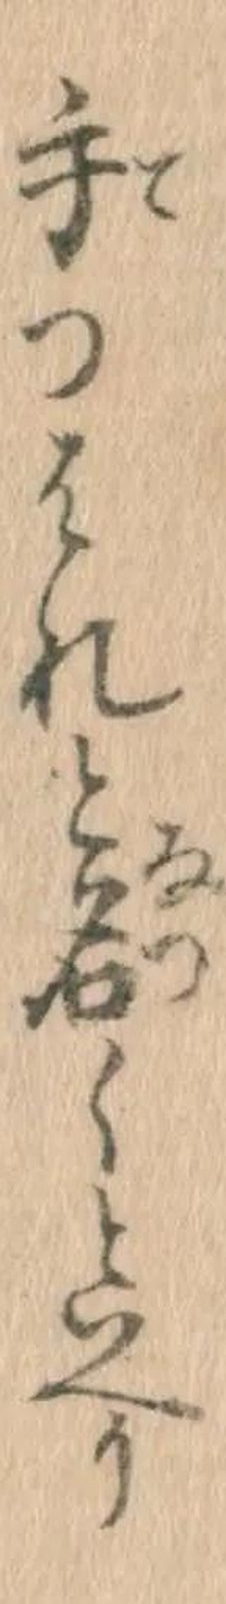手つはれと名くといへり
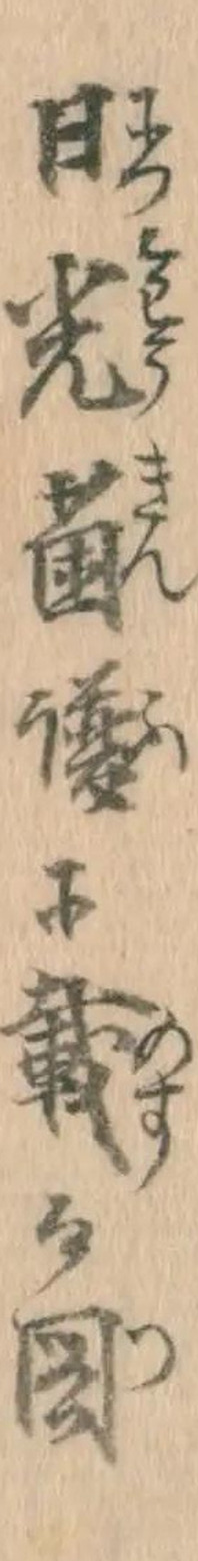日光菌譜に載る図
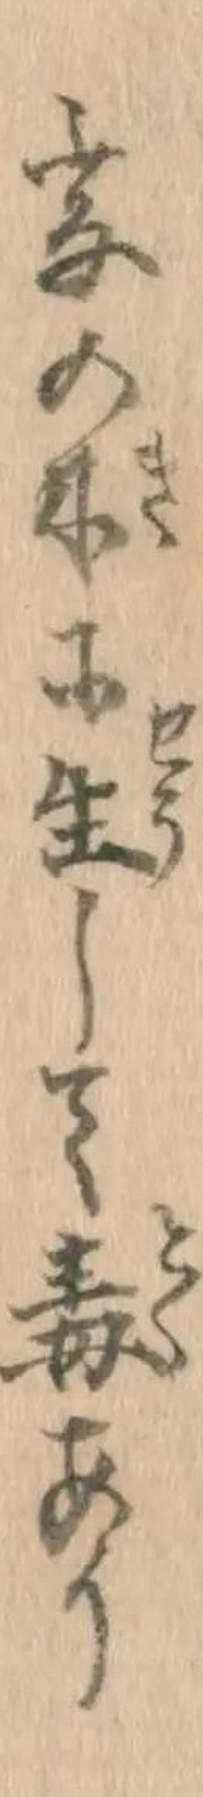ふなの木に生して毒あり
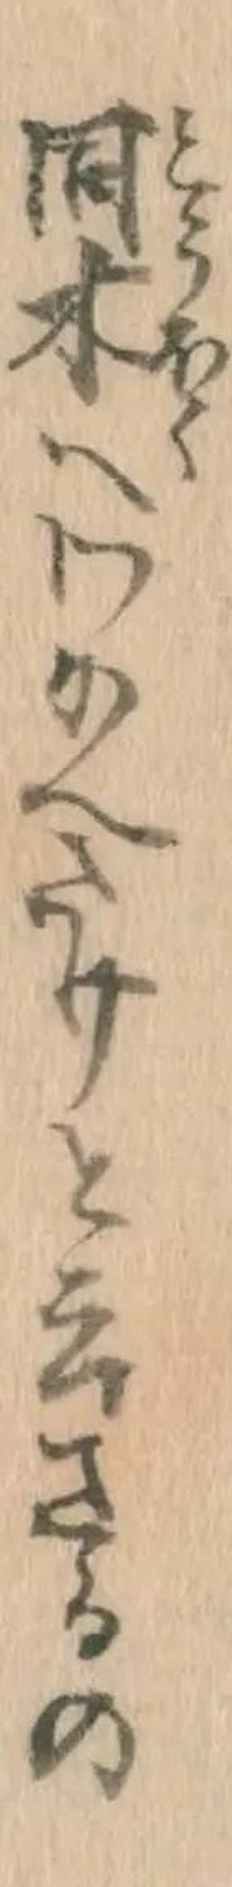同木へわかへたけと云さるの
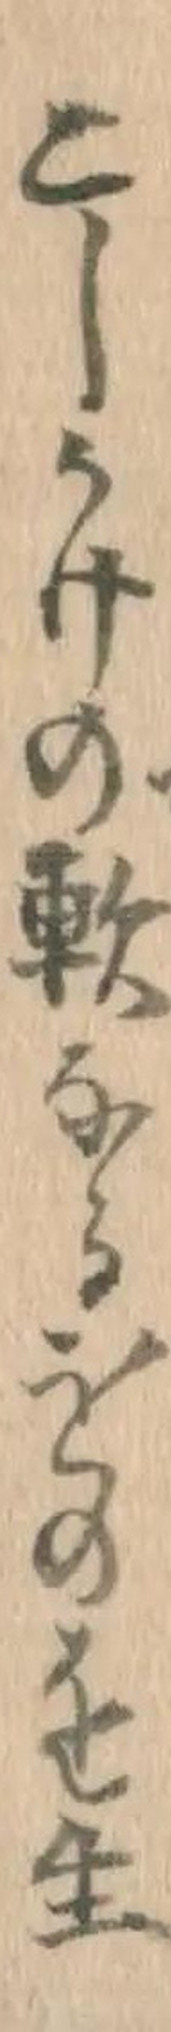こしかけの軟なるものを生
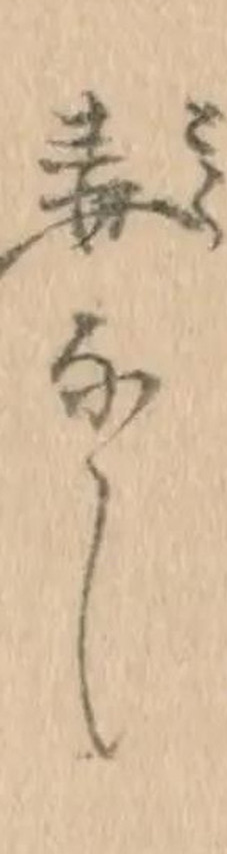毒なし

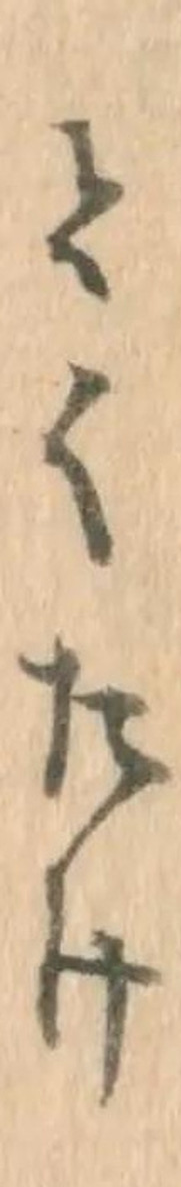とくたけ
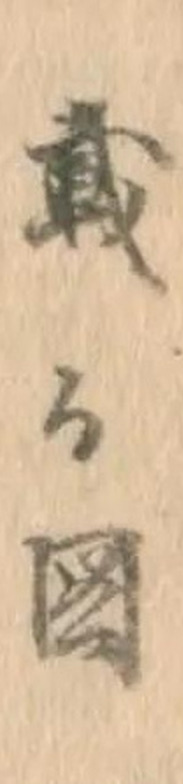載る図
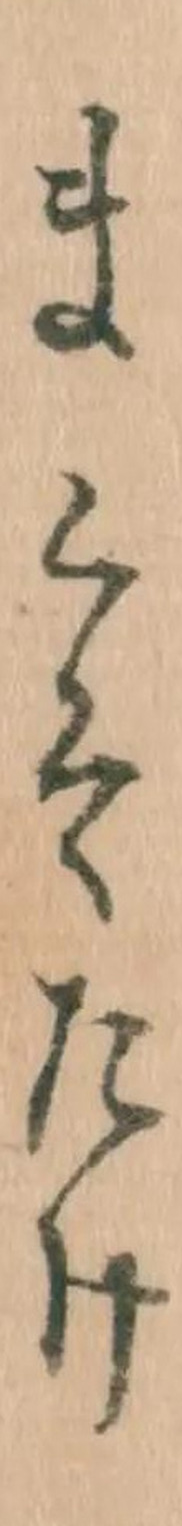まくそたけ
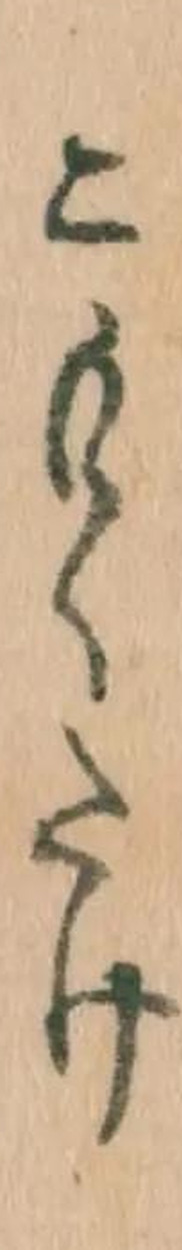こもくたけ
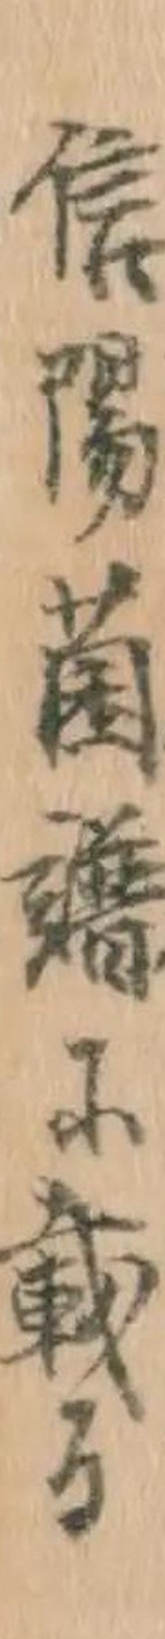信陽菌譜に載る
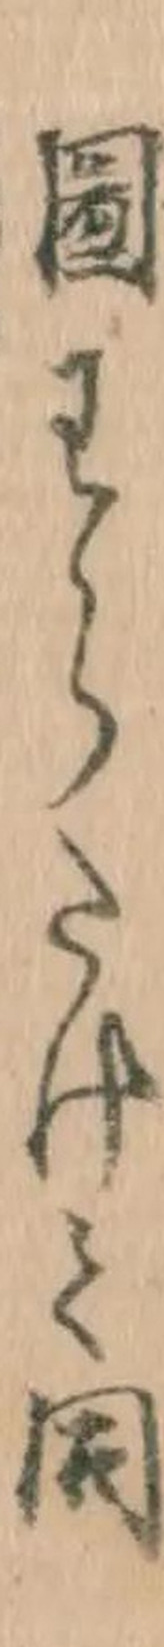図わらたけと同
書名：本草図譜. 巻58-60
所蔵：国立国会図書館 National Diet Library, JAPAN
